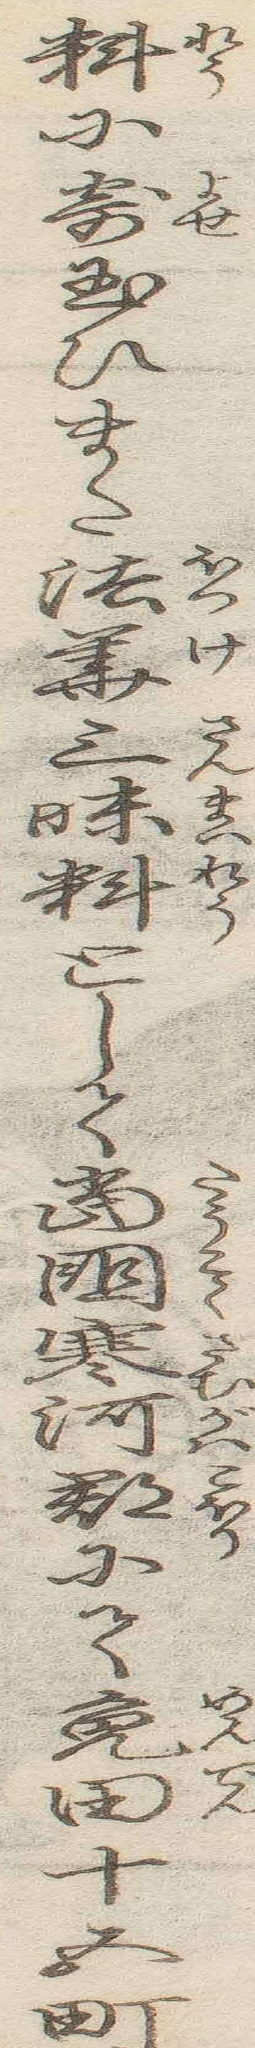料に寄玉ひまた法華三昧料として當國寒河郡にて免田十五町
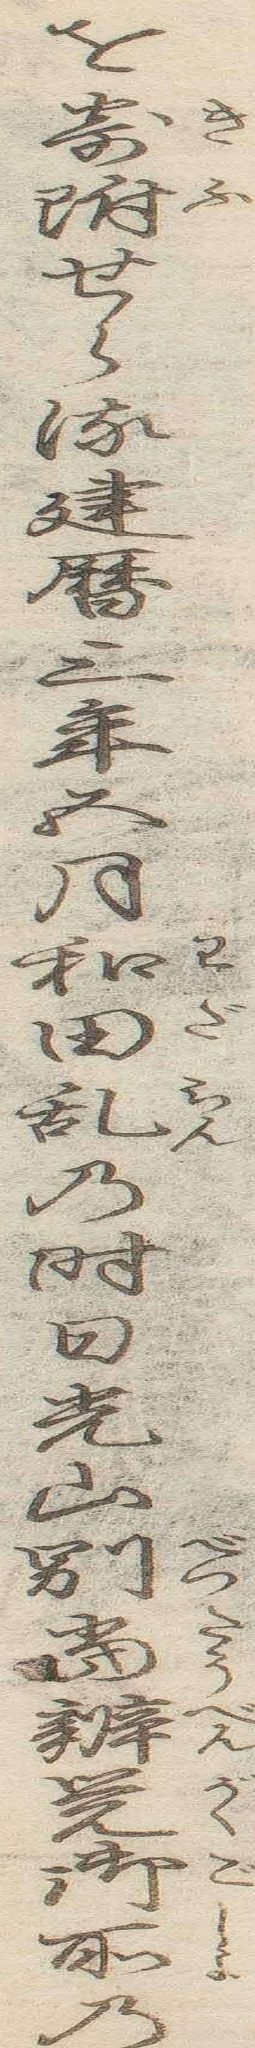を寄附せらる建曆三年五月和田乱の时日光山別當辨覚御所の
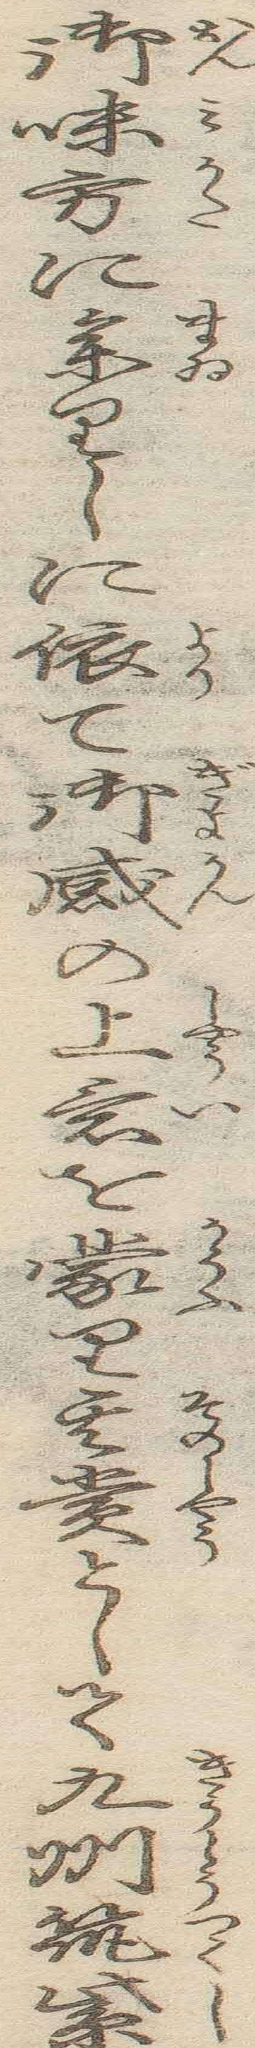御味方に参りしに依て御感の上意を蒙り其賞として九州筑紫

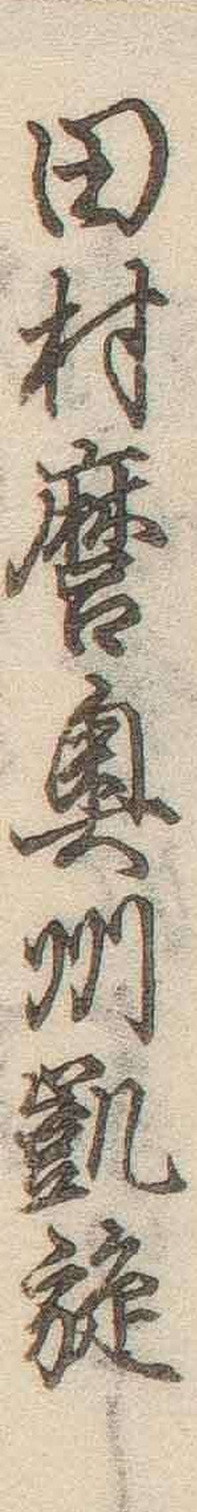田村麿奥州凱旋
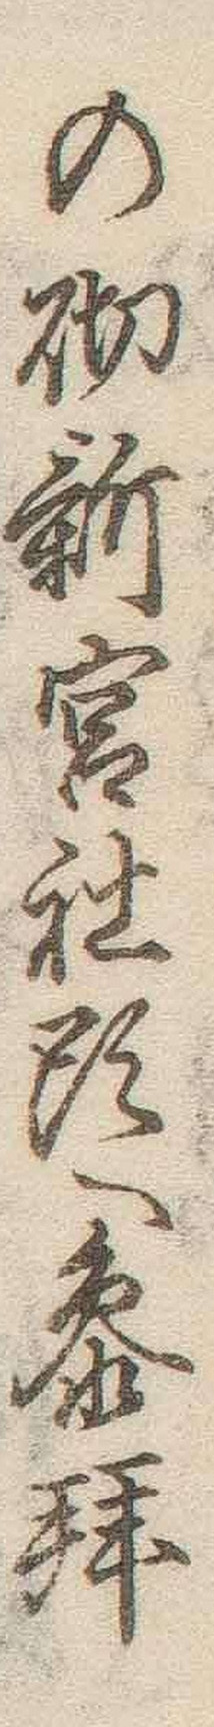の砌新宮社頭へ叅拜

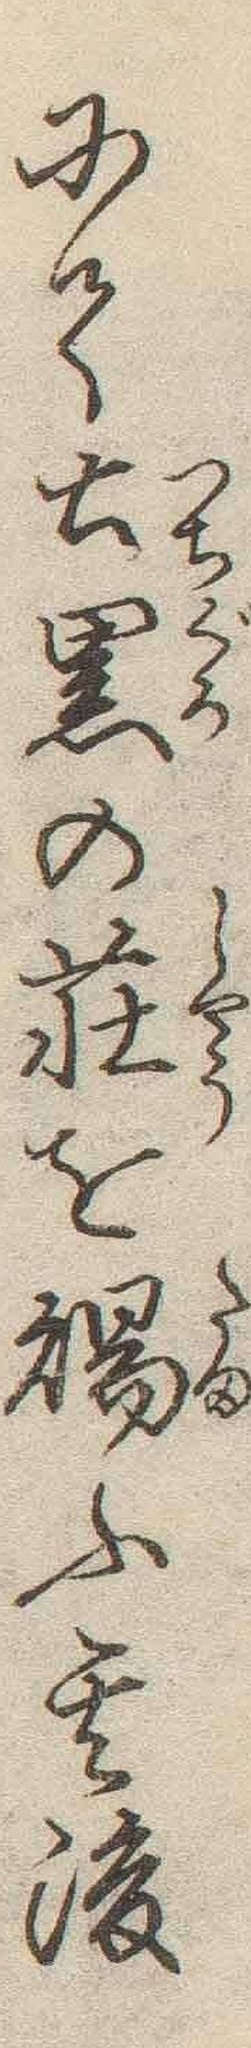にて土黒の荘を賜ふ其後
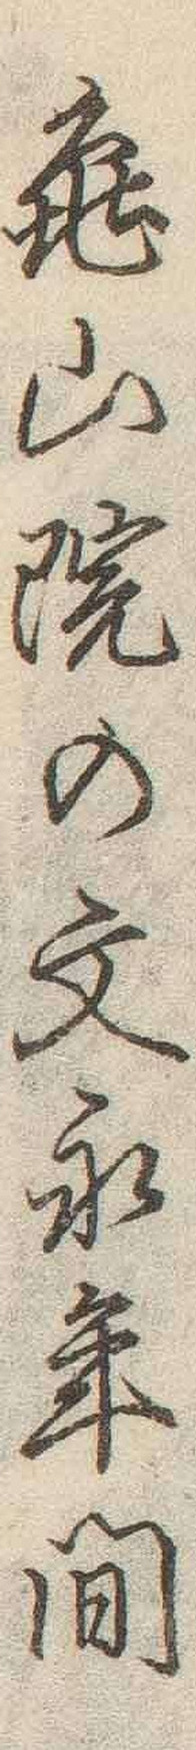龜山院の文永年間
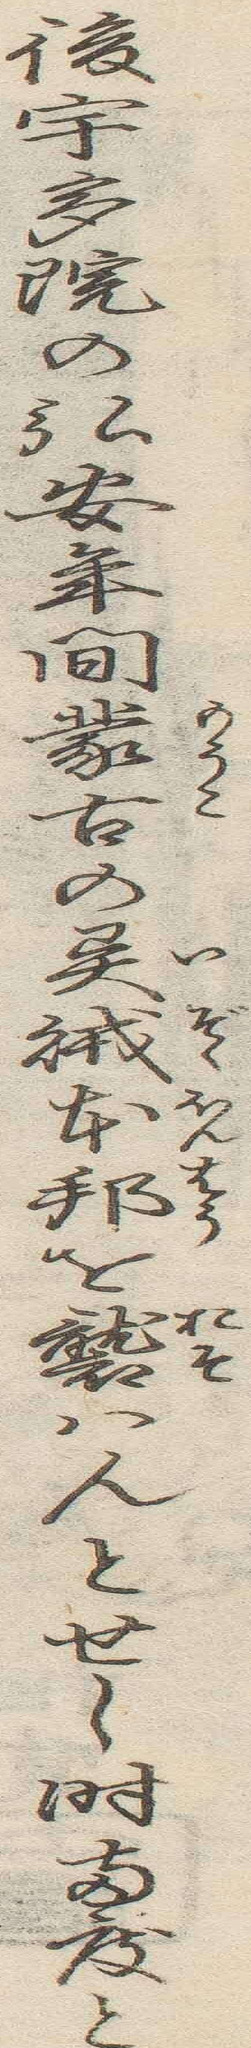後宇多院の弘安年間蒙古の異賊本邦を襲はんとせし时両度と
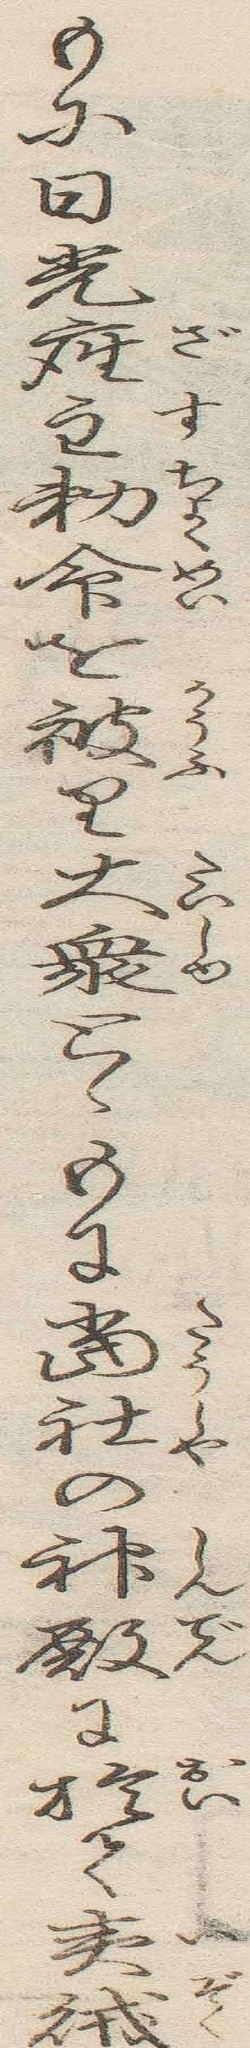もに日光座主勅命を被り大衆とゝもに當社の神殿に於て夷賊
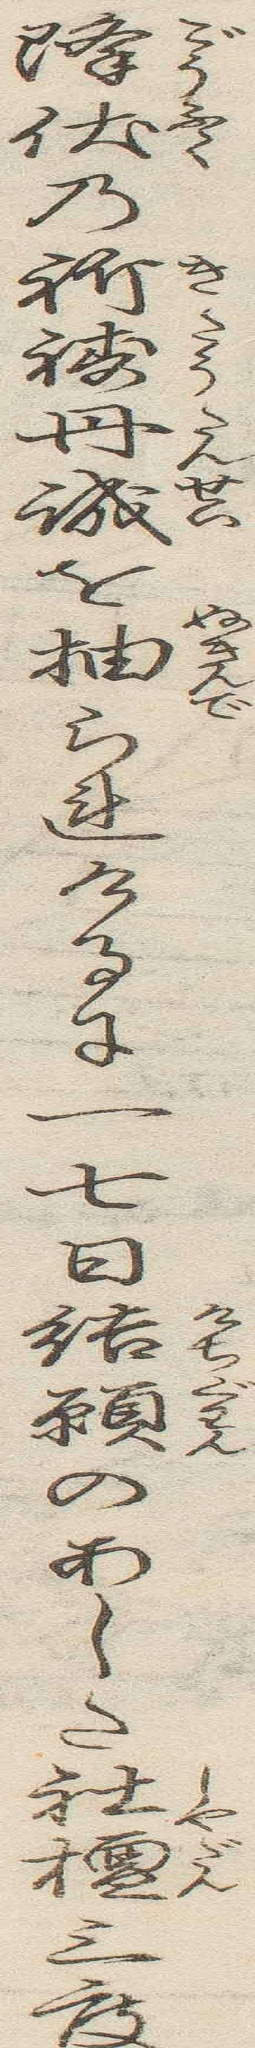降伏の祈祷丹誠を抽られけるに一七日結願のあした社擅三度
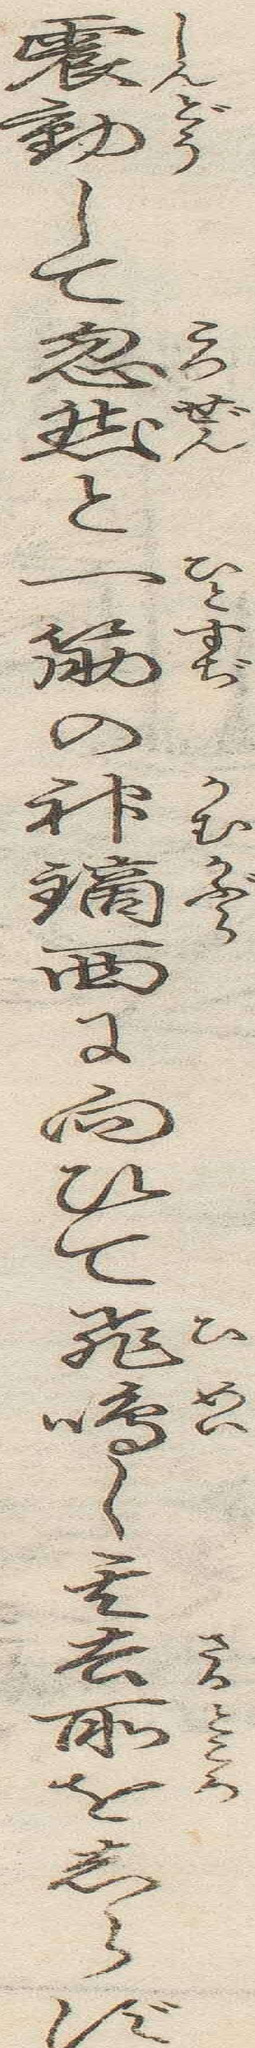震動して忽然と一筋の神鏑西に向ひて飛鳴し其去所をしらず
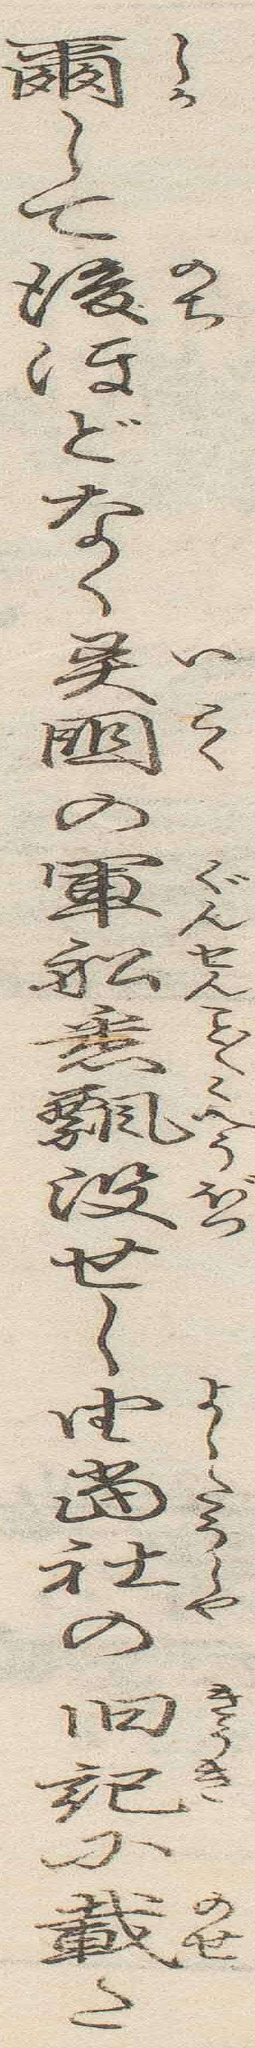爾して後ほどなく異國の軍舩悉飄没せし由當社の旧記に載た
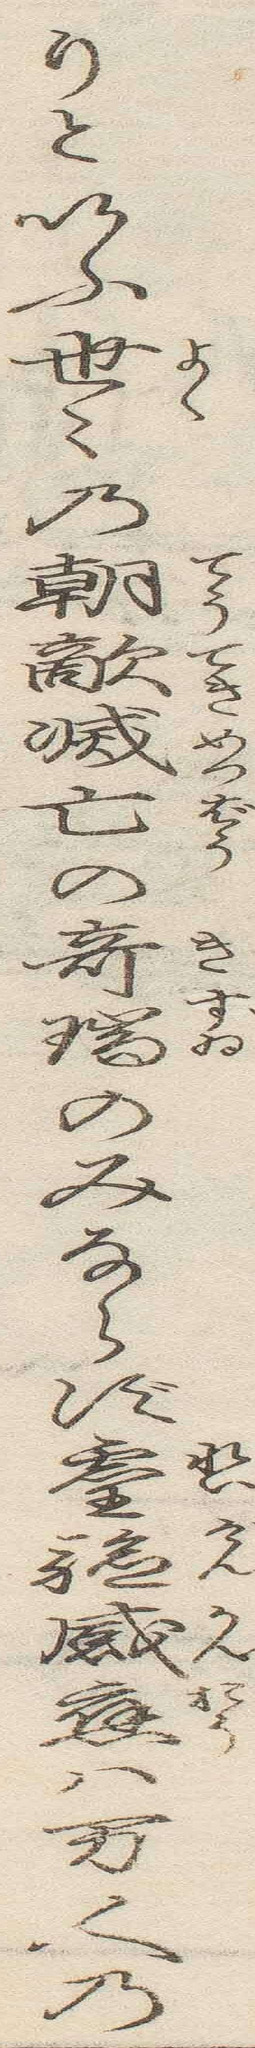りといふ世〻の朝敵滅亡の竒瑞のみならず靈驗感應は万人の
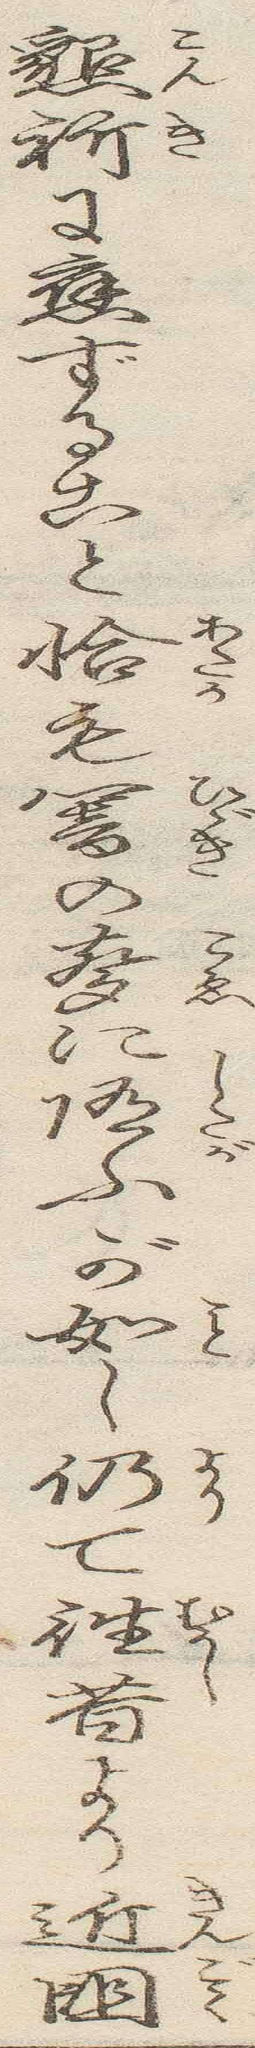懇祈に應ずること恰も響の聲に随ふが如し仍て徃昔より近國
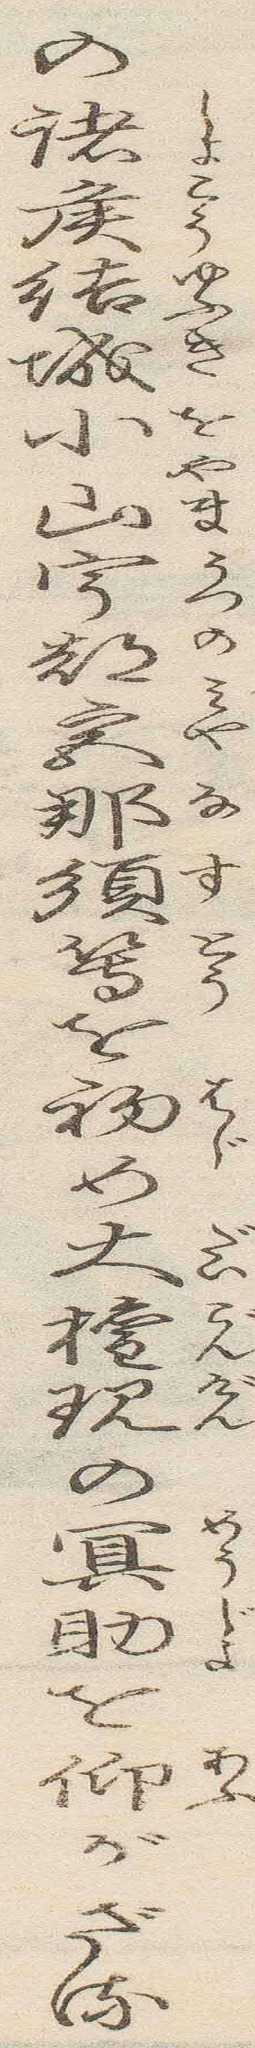の諸矦結城小山宇都宮那須等を初め大權現の冥助を仰がざる
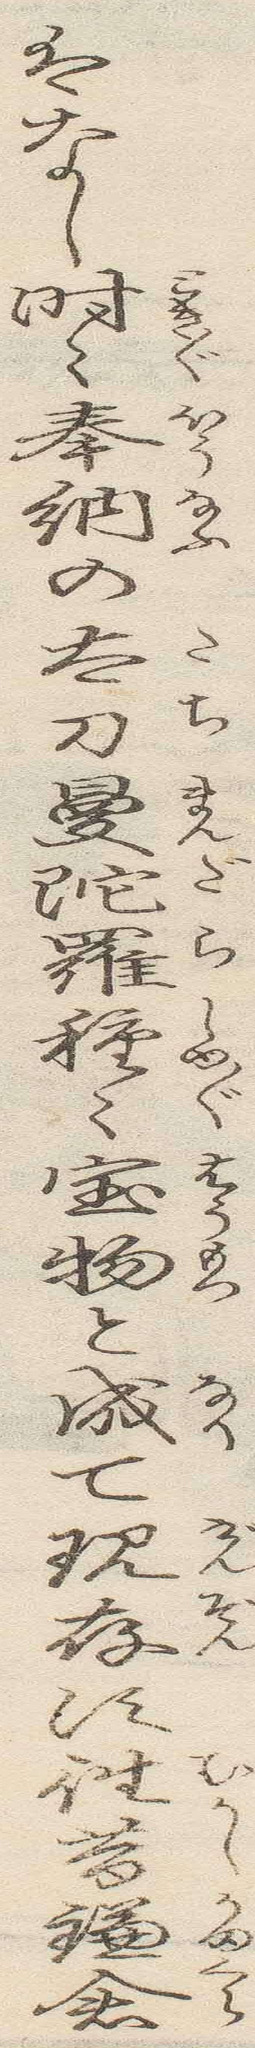はなし时〻奉納の太刀曼陀羅種〻宝物と成て現存す徃昔鎌倉
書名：日光山志
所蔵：東京学芸大学附属図書館 国文学研究資料館
